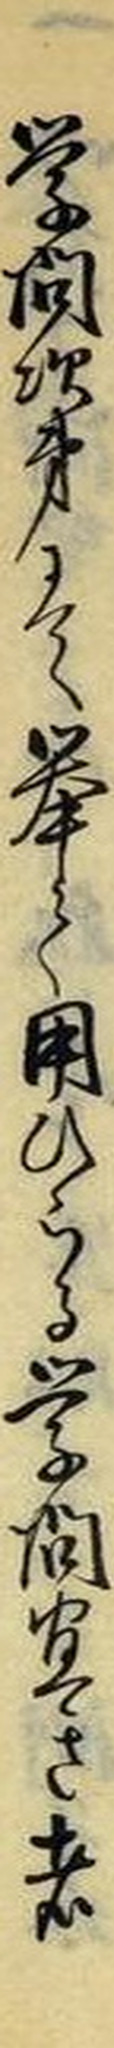学問次第にて挙て用ひらる学問宜き者
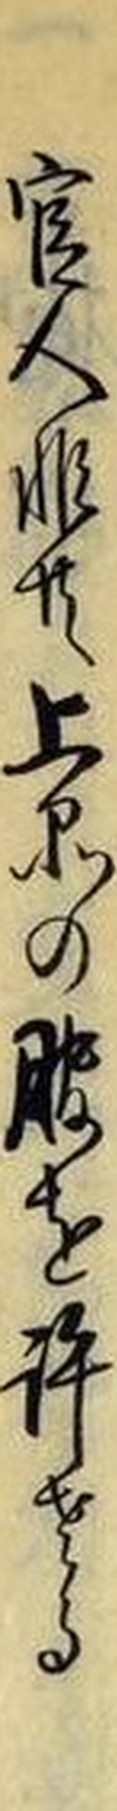官人非共上品の服を許ける
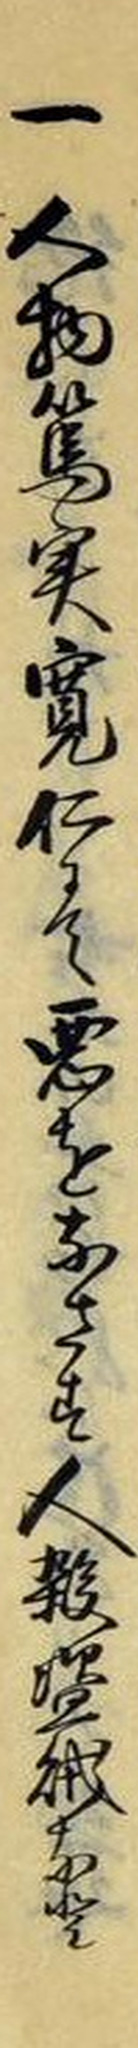一人物篤実寛仁にて悪をなさす人殺盗賊なと

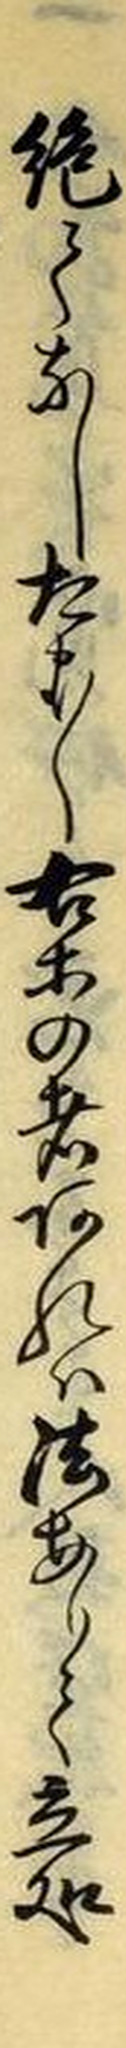絶てなしたま〳〵右等の者あれハ法ありて立処
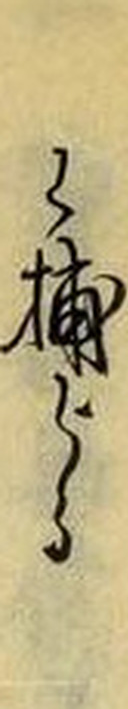に捕らる
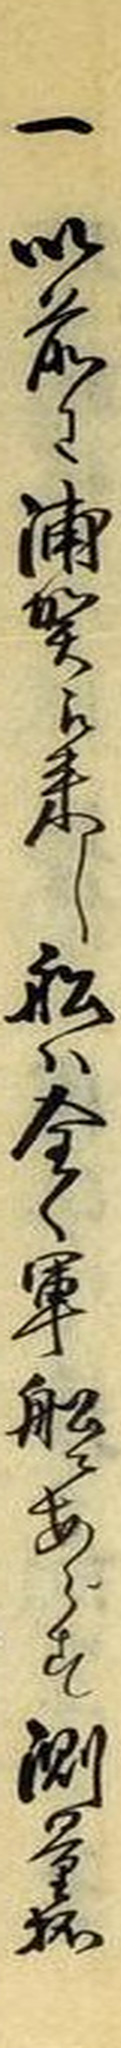一以前に浦賀江来し船ハ全く軍船ニあらす測量抔
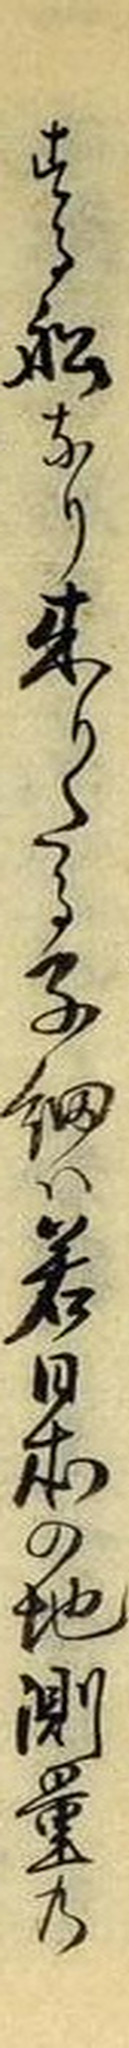する船なり来りたる子細ハ若日本の地測量の
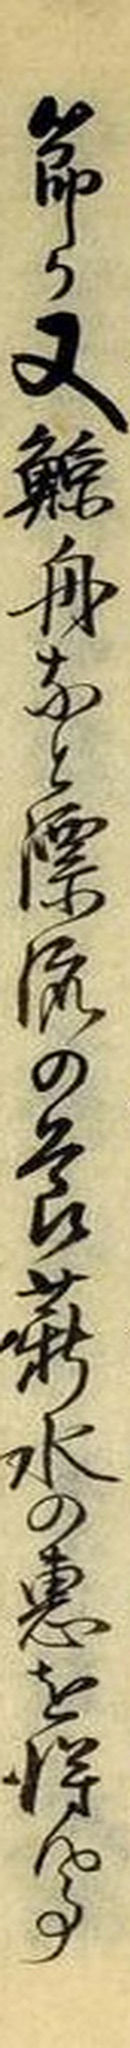節か又鯨舟なと漂流の節薪水の恵を得ん事
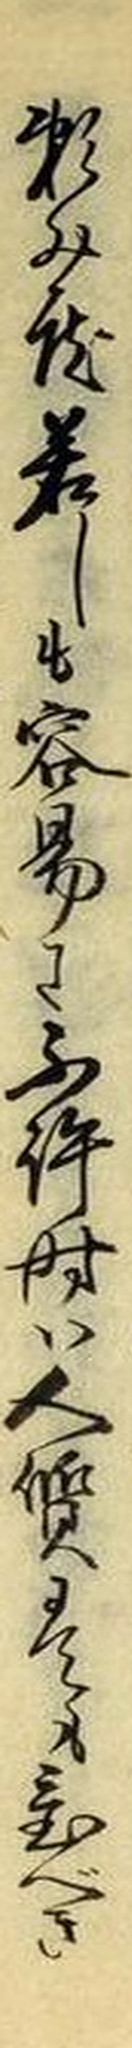頼み度若しも容易に不許時ハ人質にても置べき
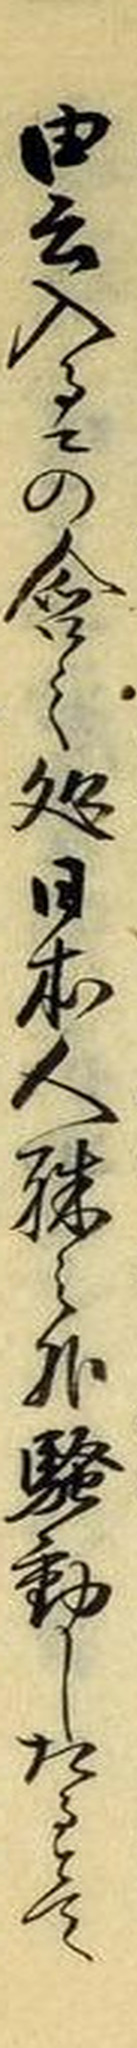由云入るニの含之処日本人殊之外騒動したるとて
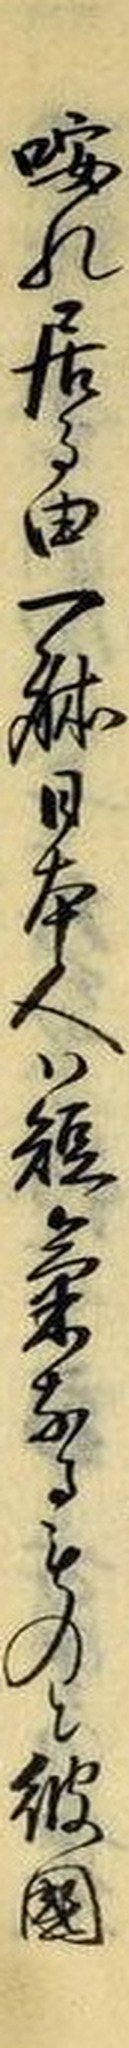咹れ居る由一躰日本人ハ短気なるものと彼国
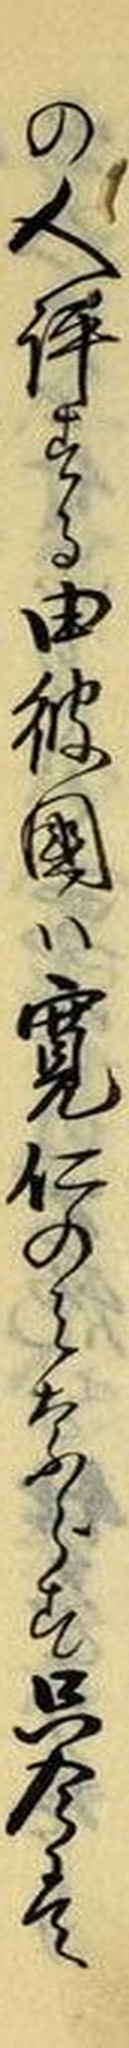の人評する由彼国ハ寛仁のミならす只今にて
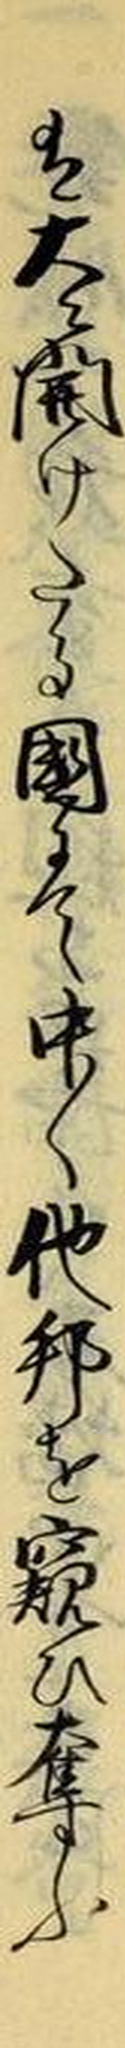も大ニ開けたる国にて中〳〵他邦を窺ひ奪ふ
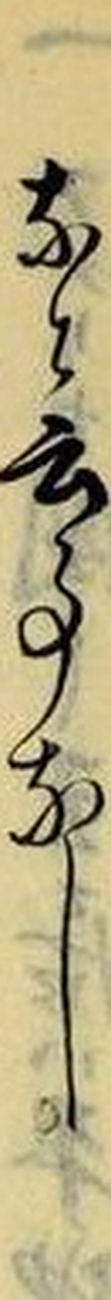なと云事なし
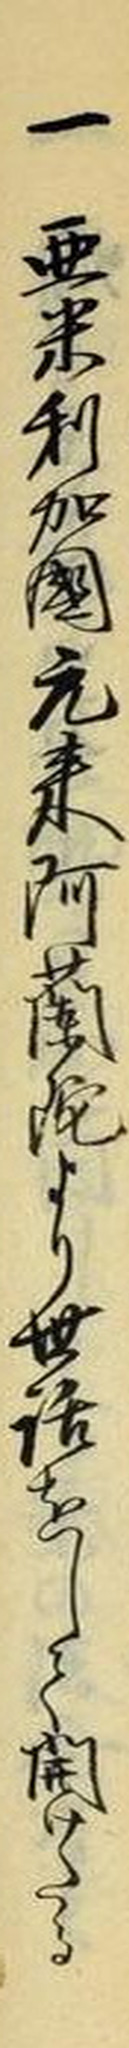一亜米利加国元来阿蘭陀より世話をして開けたる
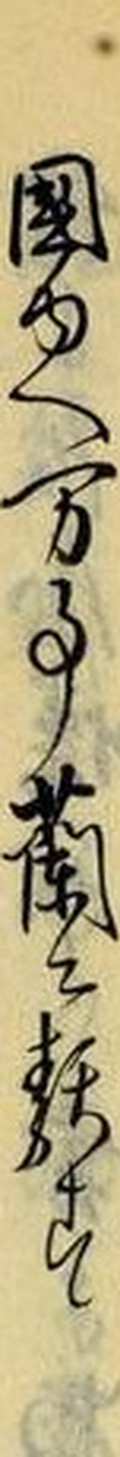国ゆへ万事蘭ニ類す
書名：漂客談奇（備考雑録写8）
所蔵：福井県文書館 Fukui Prefectural Archives
